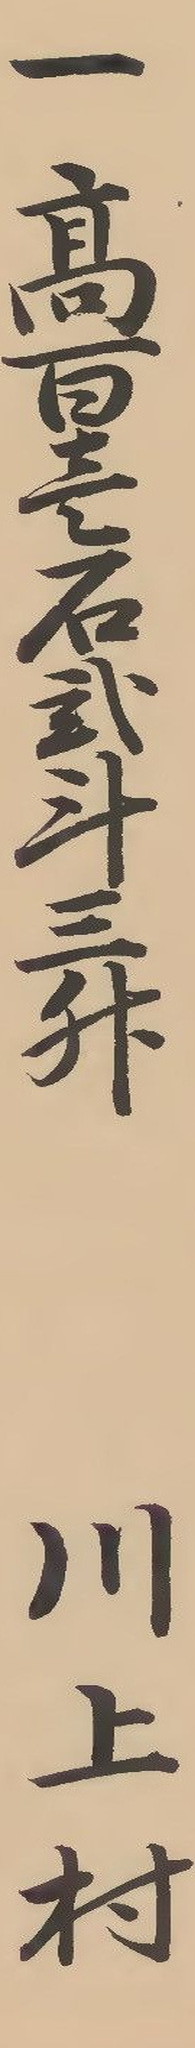一高百壱石弐斗三升川上村

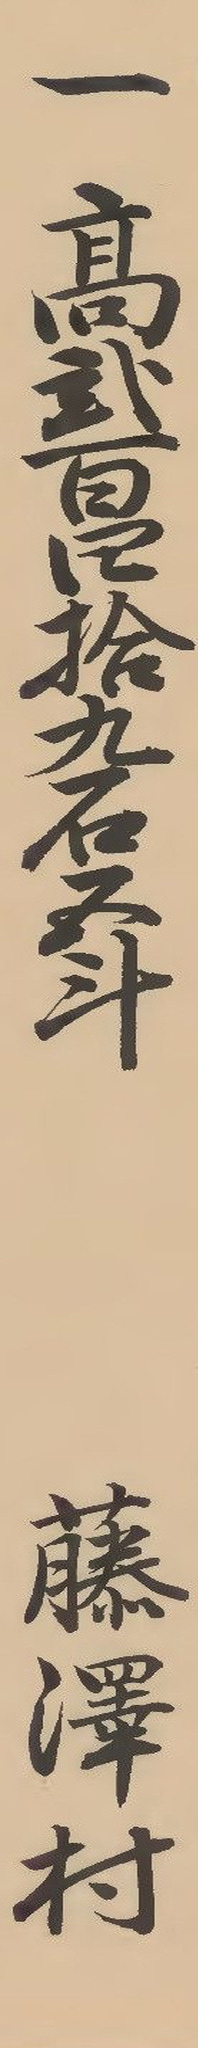一高弐百四拾九石五斗藤沢村
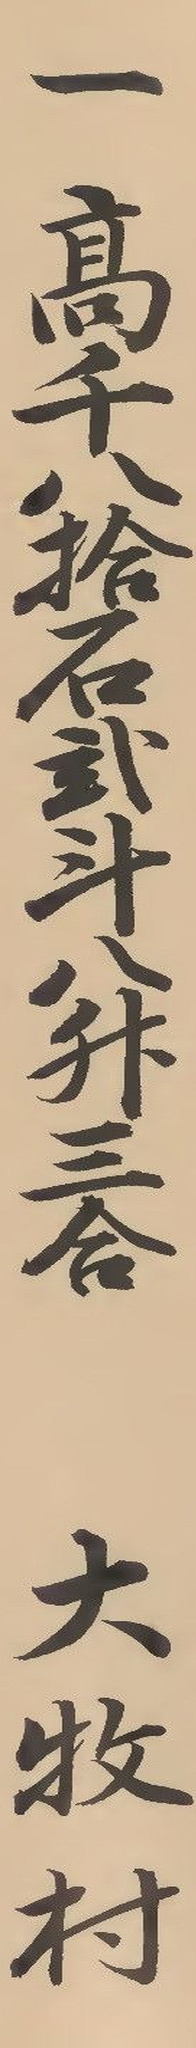一高千八拾石弐斗八升三合大牧村
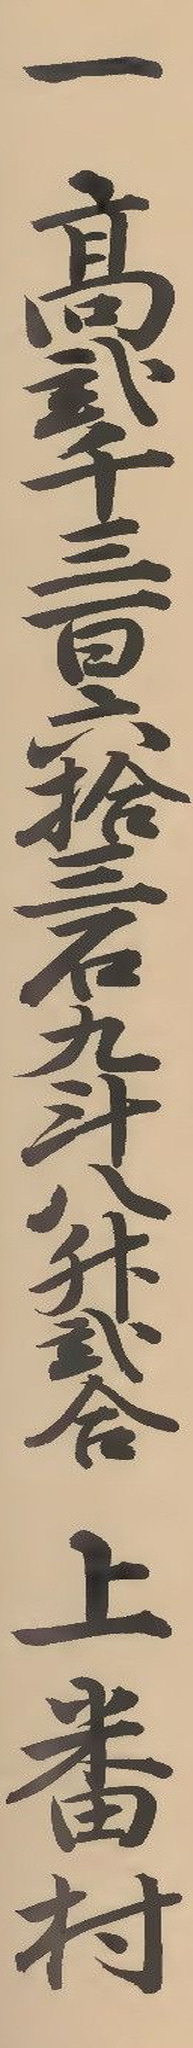一高弐千三百六拾三石九斗八升弐合上番村
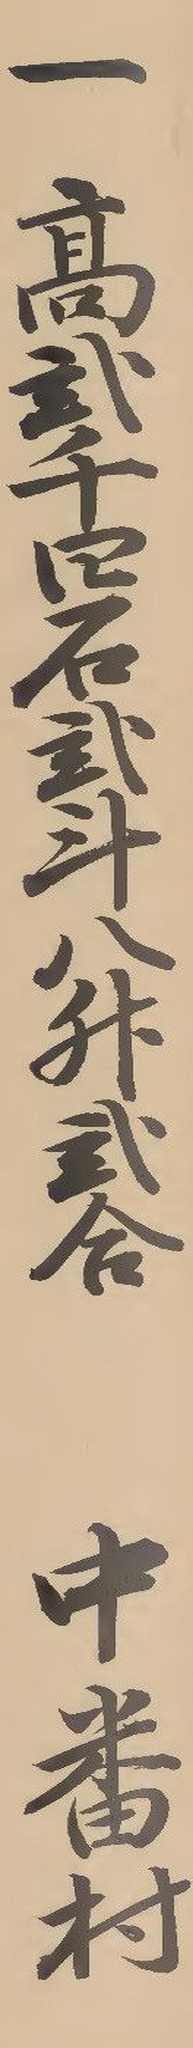一高弐千四石弐斗八升弐合中番村
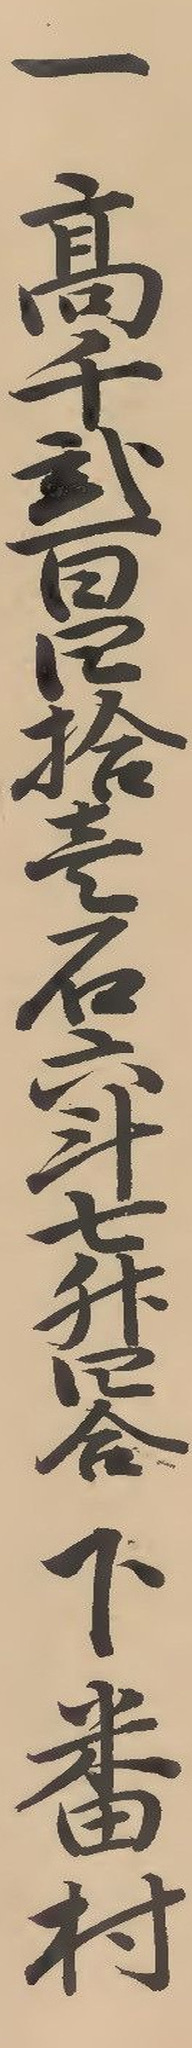一高千弐百四拾壱石六斗七升四合下番村
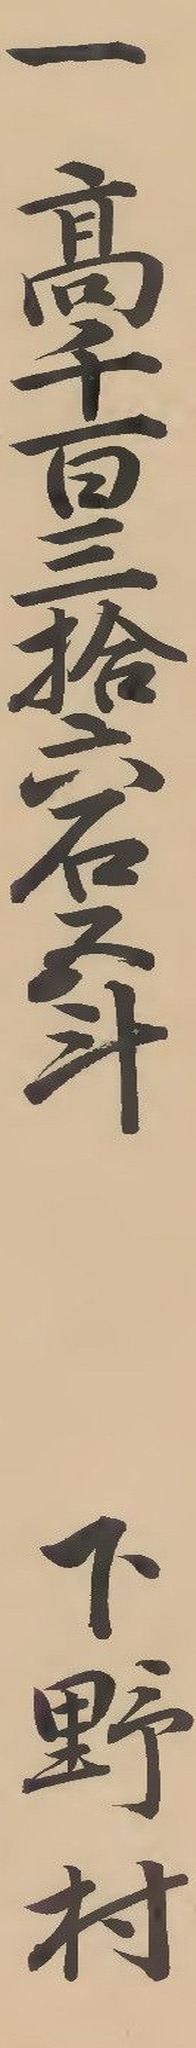一高千百三拾六石五斗下野村

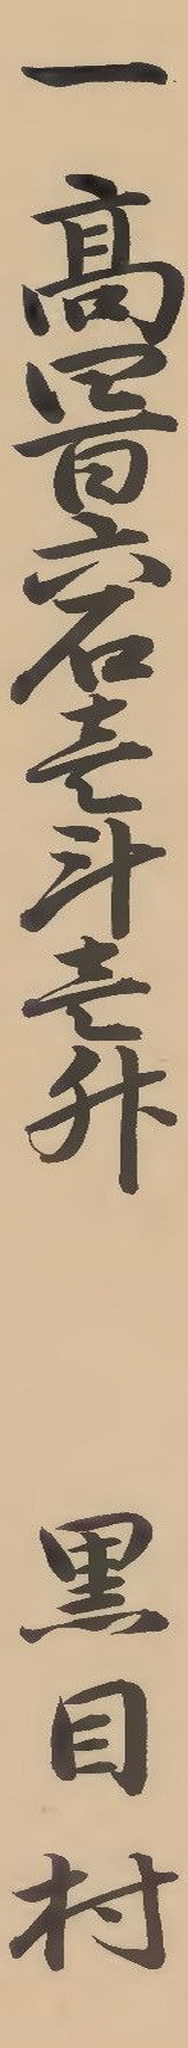一高四百六石壱斗壱升黒目村
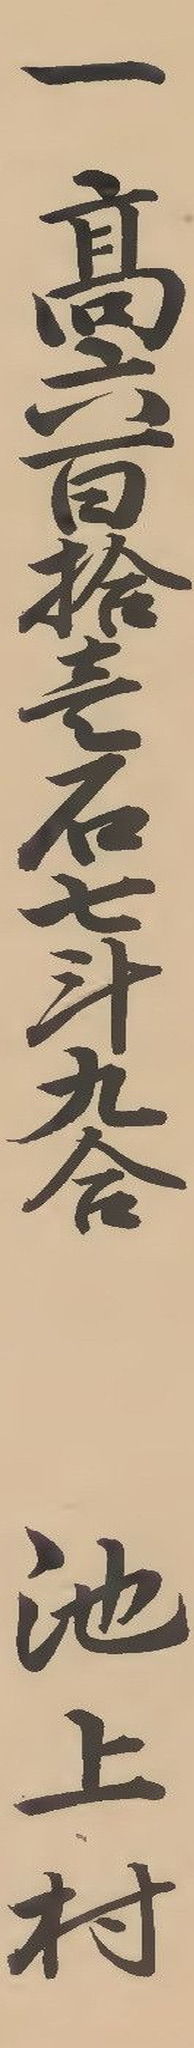一高六百拾壱石七斗九合池上村
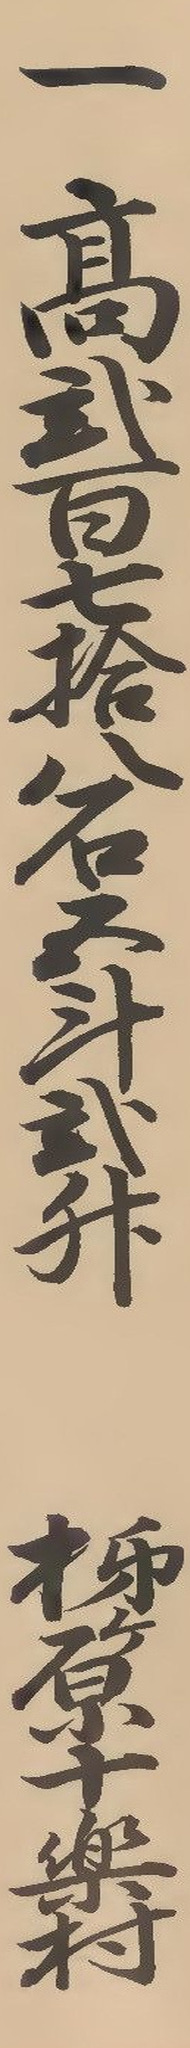一高弐百七拾八石五斗弐升柿ヶ原十楽村
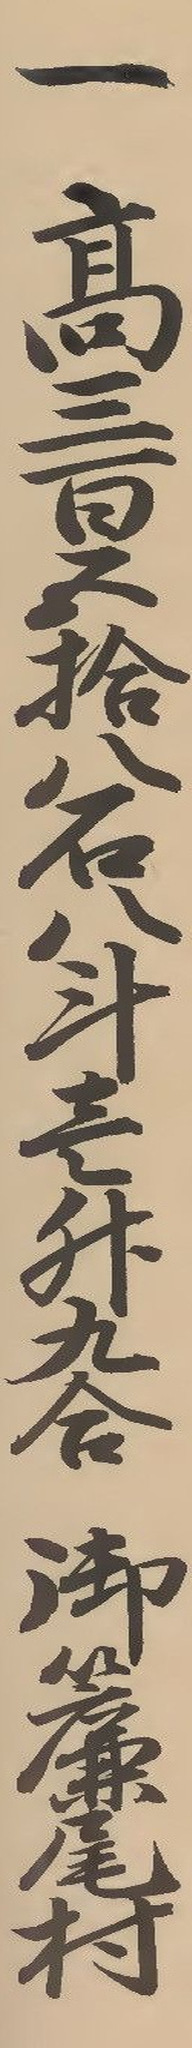一高三百五拾八石八斗壱升九合御簾尾村
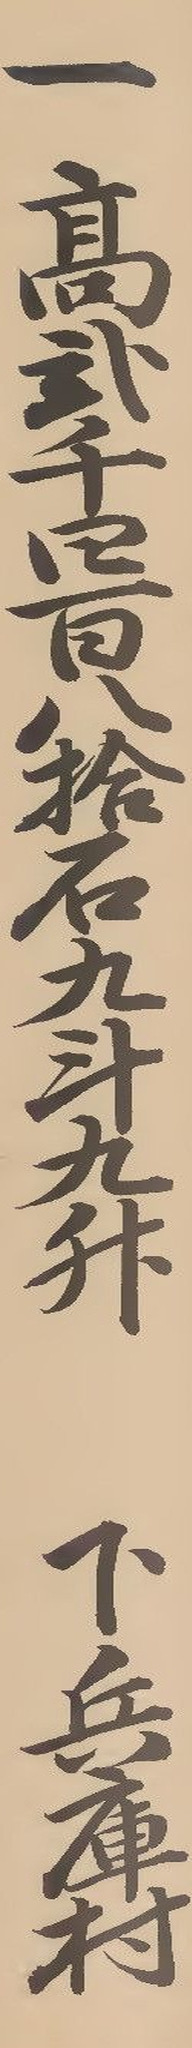一高弐千四百八拾石九斗九升下兵庫村
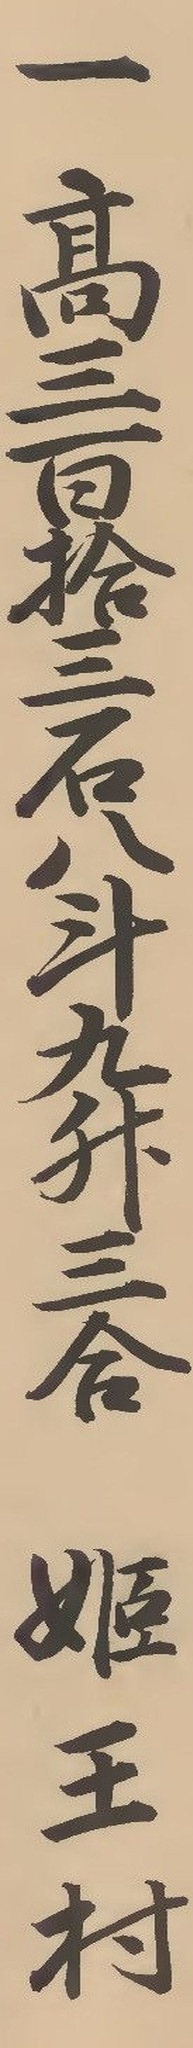一高三百拾三石八斗九升三合姫王村
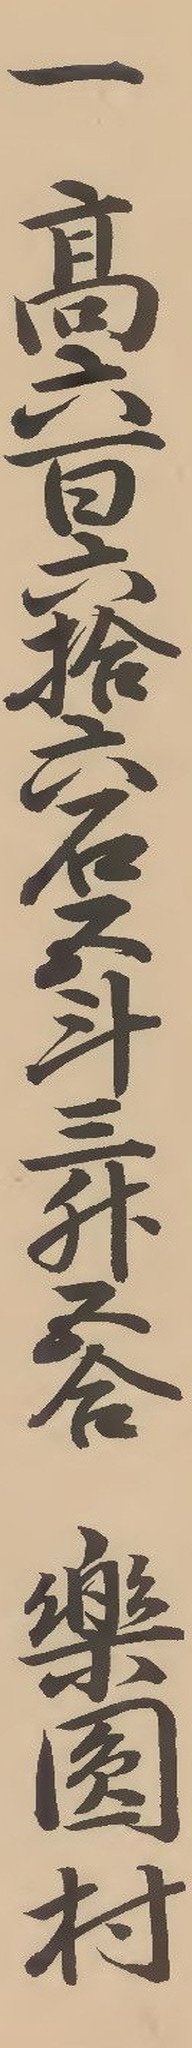一高六百六拾六石五斗三升五合楽円村
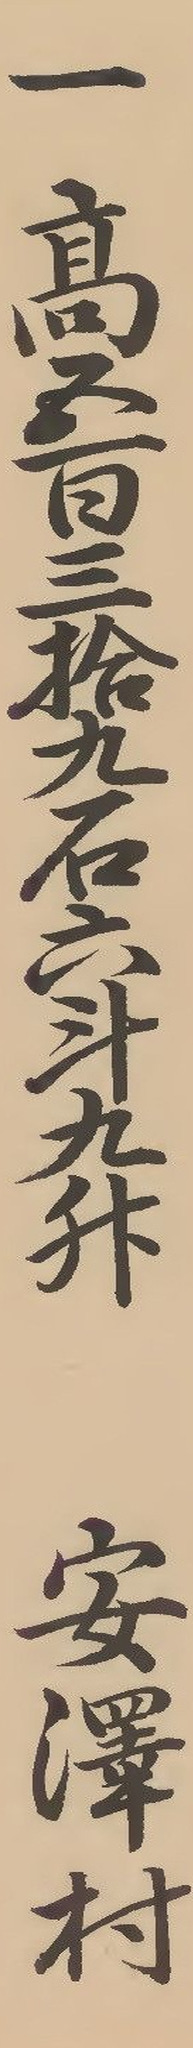一高五百三拾九石六斗九升安沢村

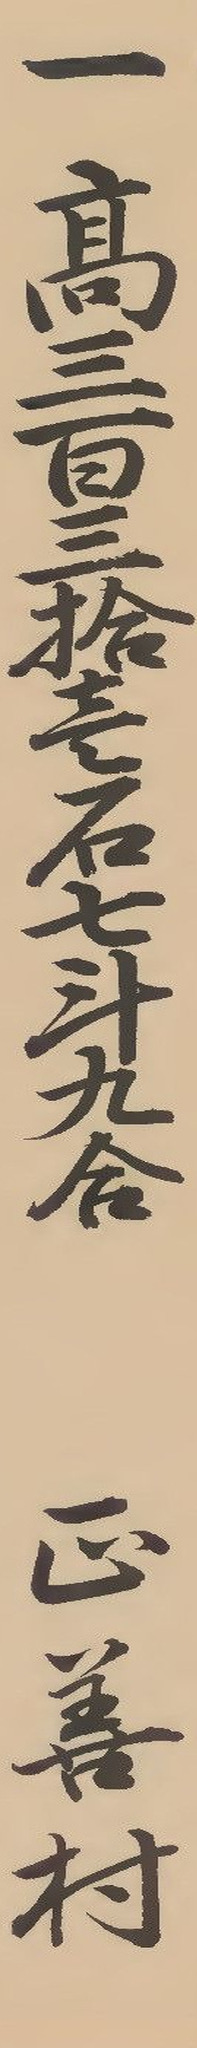一高三百三拾壱石七斗九合正善村
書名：越前国郷帳
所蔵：国立公文書館 National Archives of Japan
